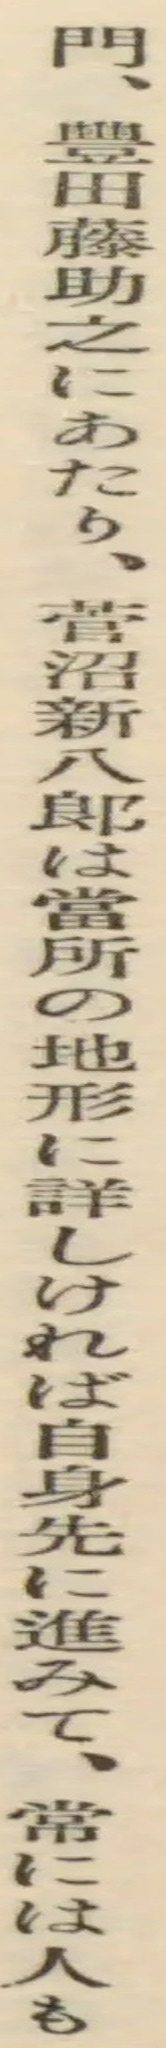門、豊田藤助之にあたり、菅沼新八郎は当所の地形に詳しければ自身先に進みて、常には人も
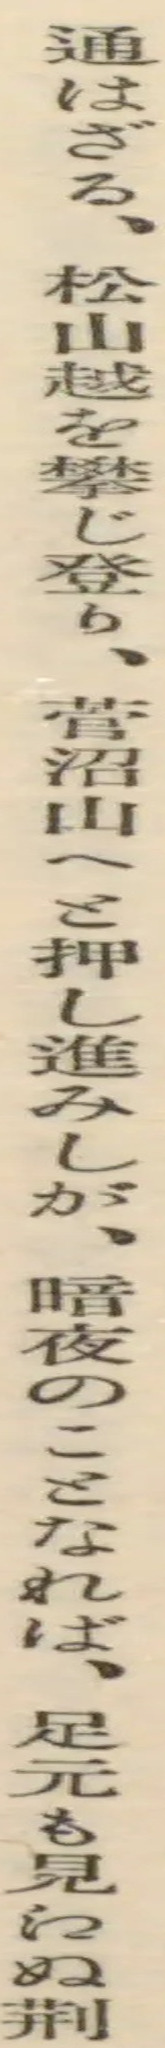通はざる、松山越を攀じ登り、菅沼山へと押し進みしが、暗夜のことなれば、足元も見えぬ荊
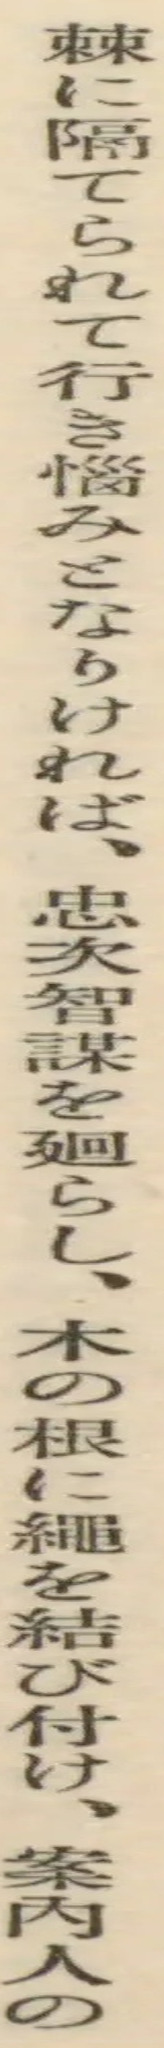棘に隔てられて行き悩みとなりければ、忠次智謀を廻らし、木の根に縄を結び付け、案内人の
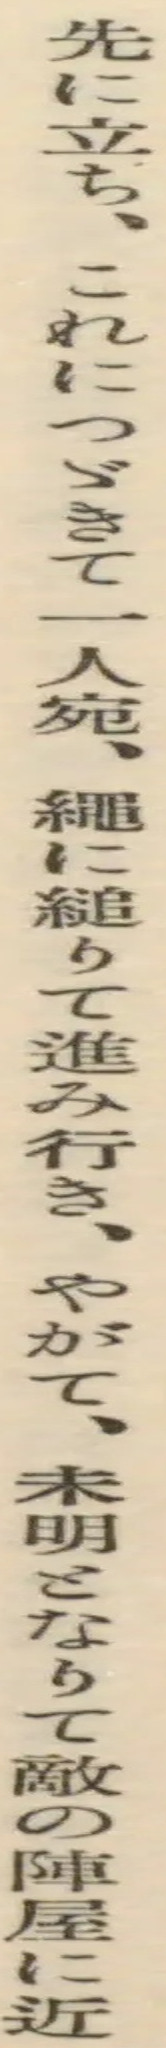先に立ち、これにつゞきて一人宛、縄に縋りて進み行き、やがて、未明となりて敵の陣屋に近
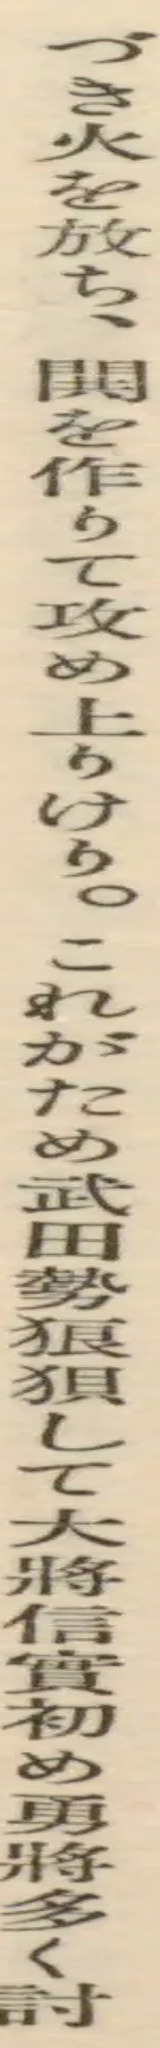づき火を放ち、鬨を作りて攻め上りけり。これがため瀧田勢狼狽して大将信実初め勇将多く討
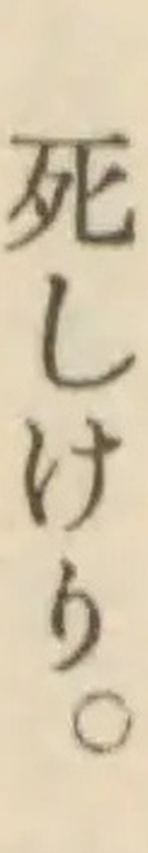死しけり。
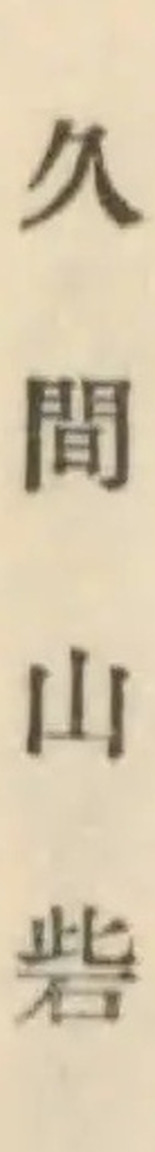久間山砦
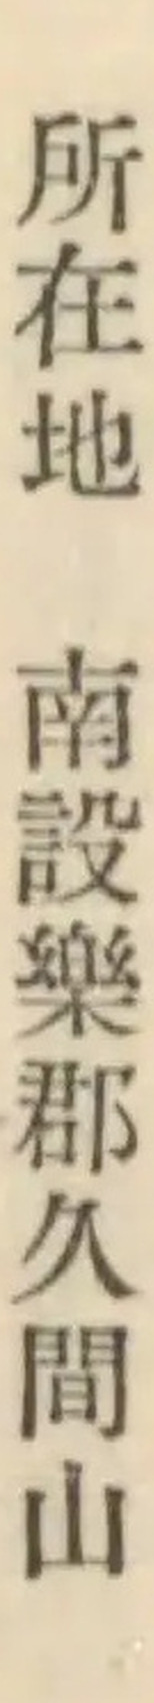所在地南設楽郡」久間山
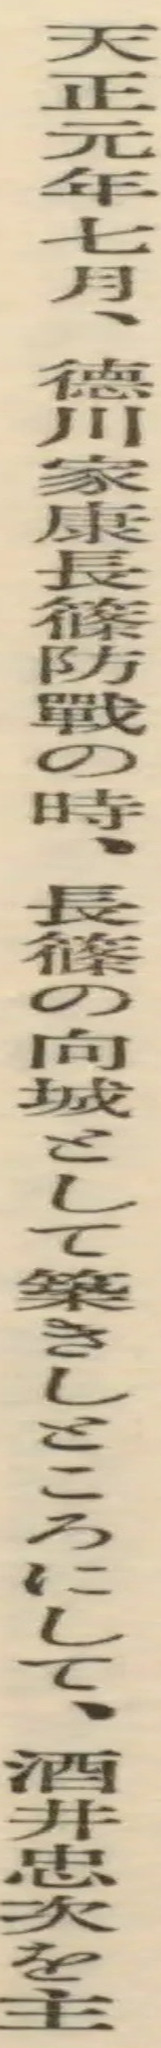天正元年七月、徳川家康長篠防戦の時、長篠の向城として築きしところにして、酒井忠次を主
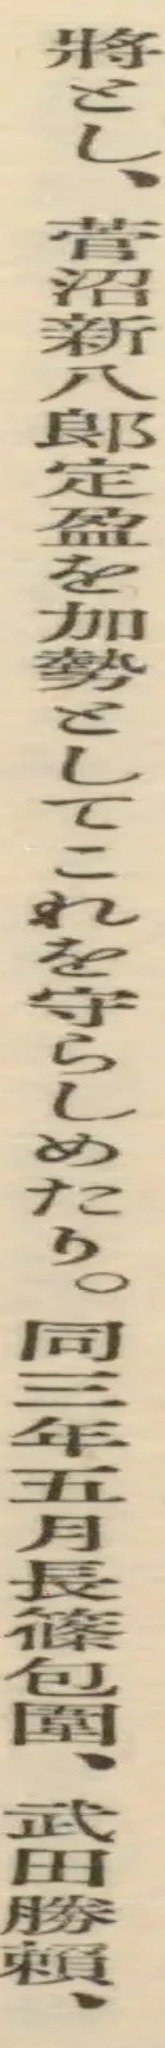将とし、菅沼新八郎定盈を加勢としてこれを守らしめたり。同三年五月長篠包囲、武田勝頼、
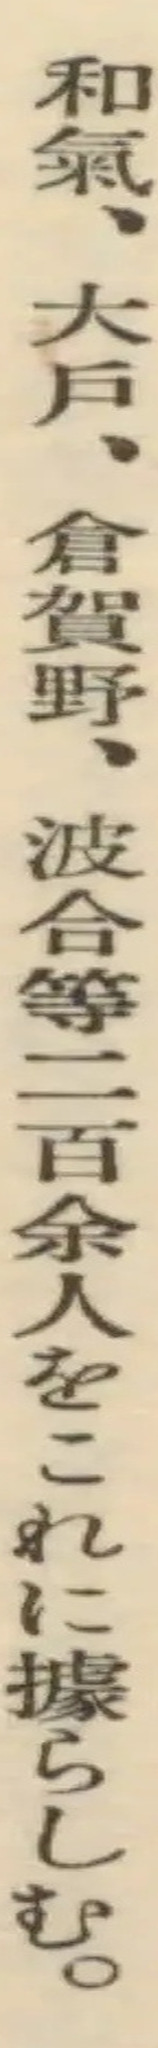和気、大戸、倉賀野、波合等二百余人をこれに拠らしむ。
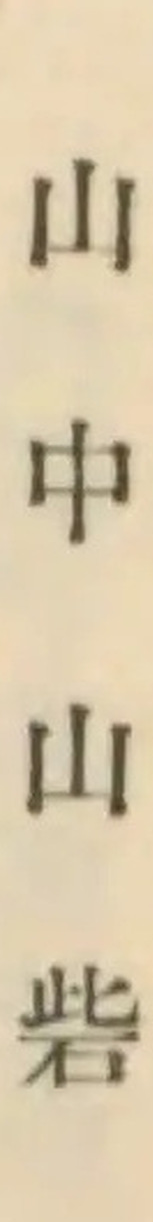山中山砦
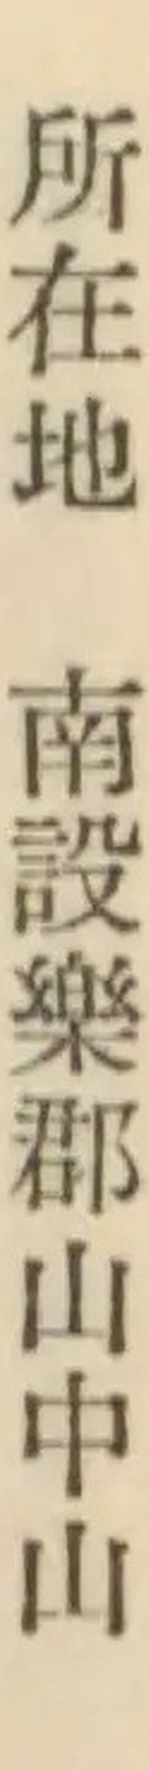所在地南設楽郡山中山
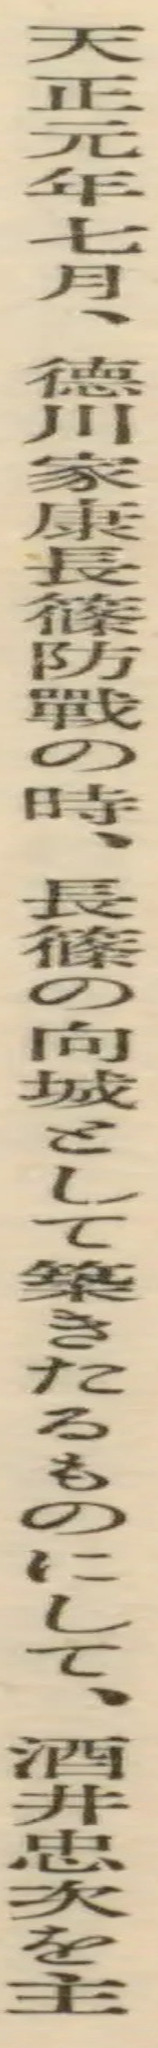天正元年七月、徳川家康長篠防戦の時、長篠の向城として築きたるものにして、酒井忠次を主
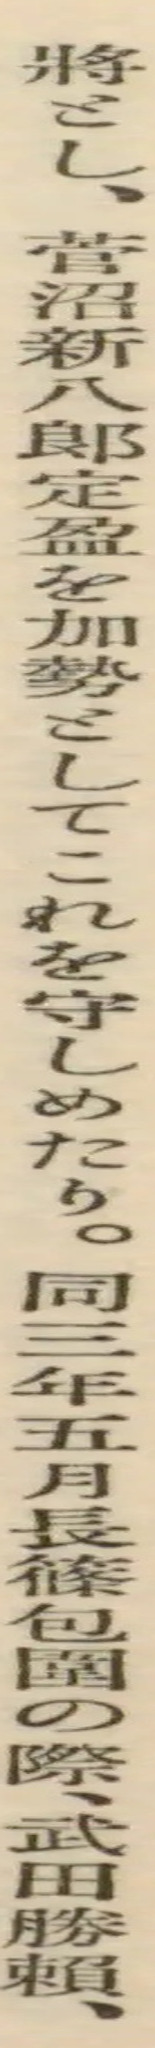将とし、菅沼新八郎定盈を加勢としてこれを守しめたり。同三年五月長篠包囲の際、武田勝頼、
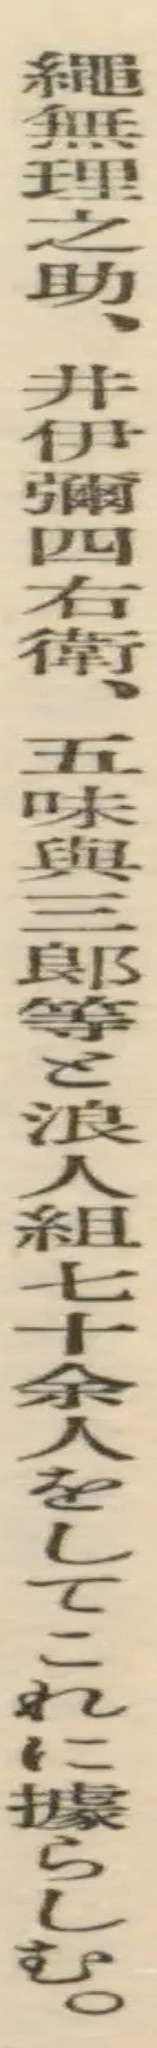縄無理之助、井伊弥四右衛、五味與三郎等と浪人組七十余人をしてこれに拠らしむ。
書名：東三河之古城
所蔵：国立国会図書館 National Diet Library, JAPAN
